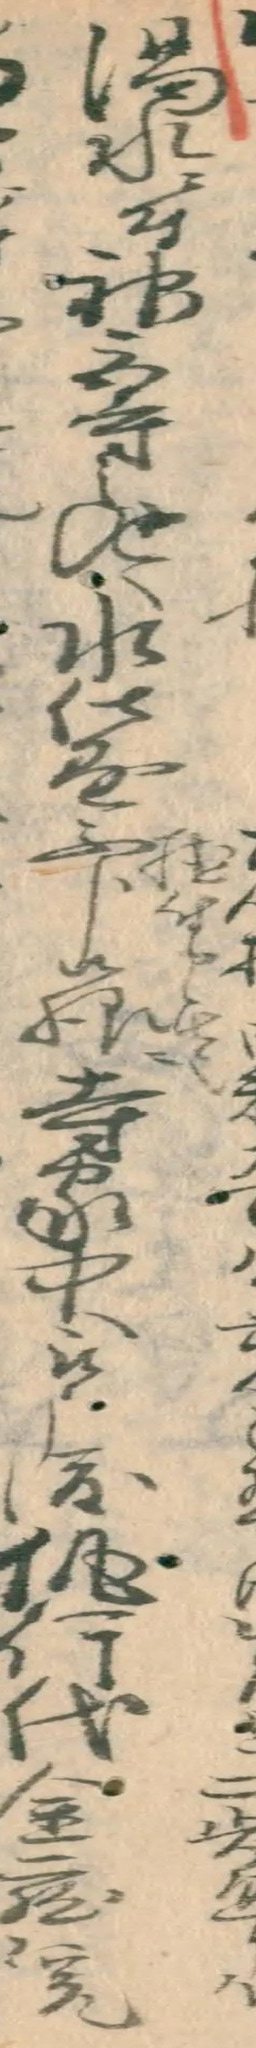一渇水ニ付神宮寺之池へ水仕懸不申候様ニ寺家中へ被申渡執行代金蔵院
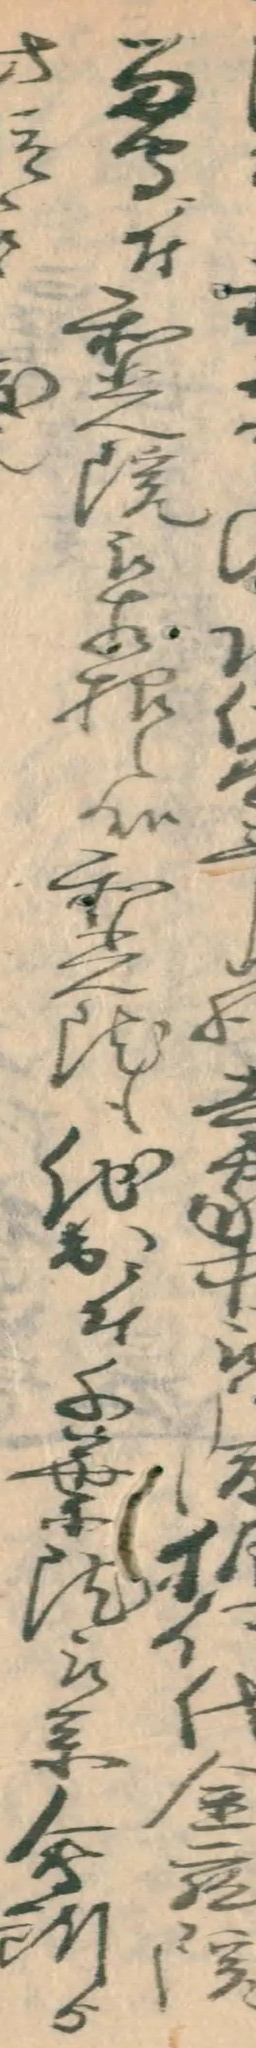留守ニ付和光院被相招候処和光院も他出ニ付千葉院被参会所ゟ
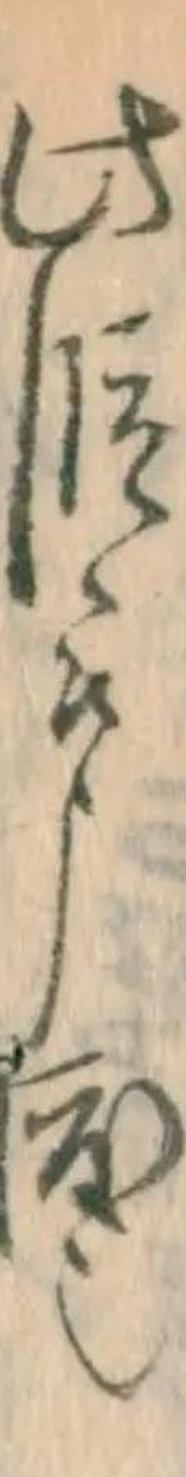此段被申渡也
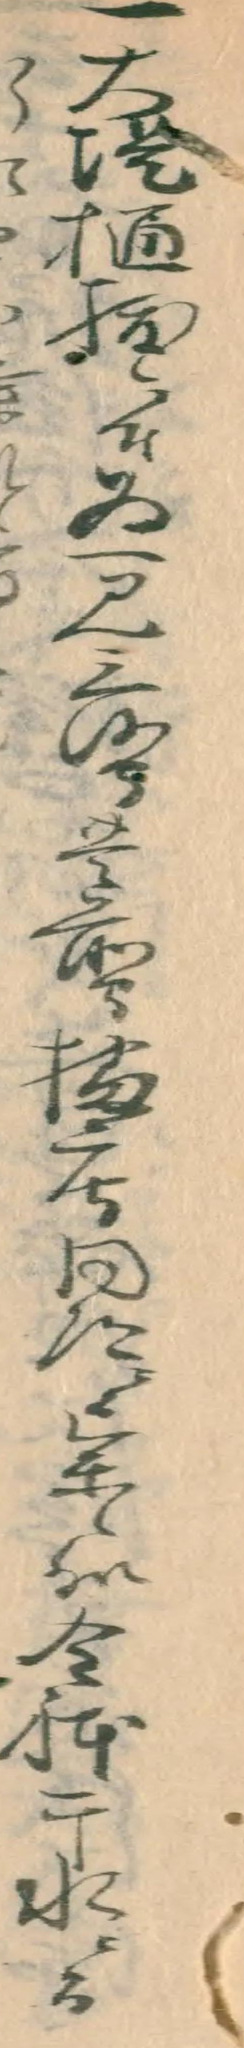一大堤樋抜候ニ付為一見三河守豊前守播磨守同道ニ而参候処全体干水ニ而
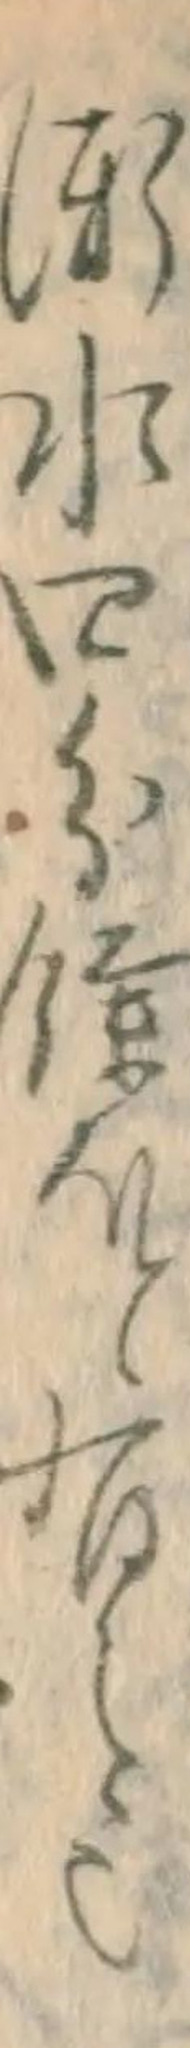漸水四分余ほと有之也
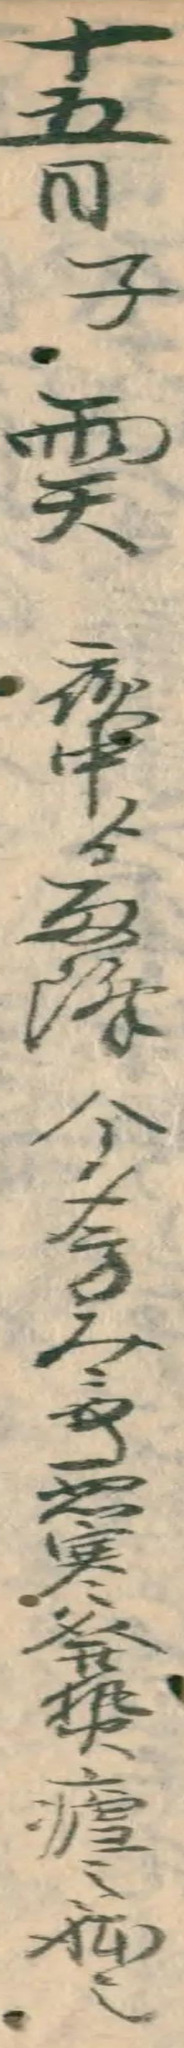十五日子雨天夜中ゟ雨降今夕方みて悪寒発熱瘧之体也
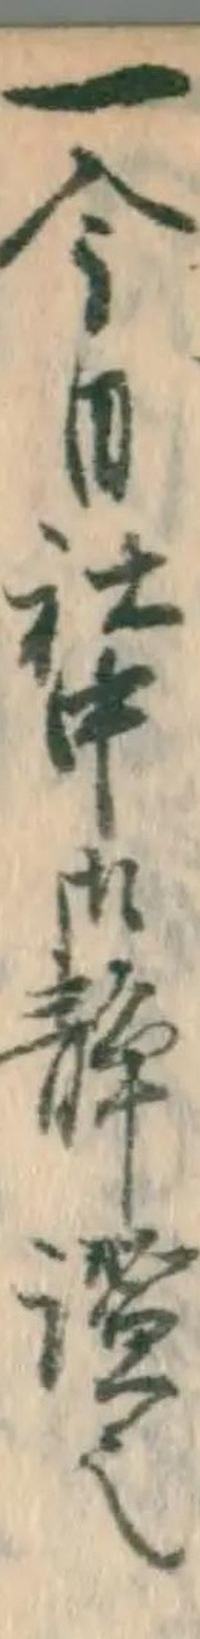一今日社中御静謐也
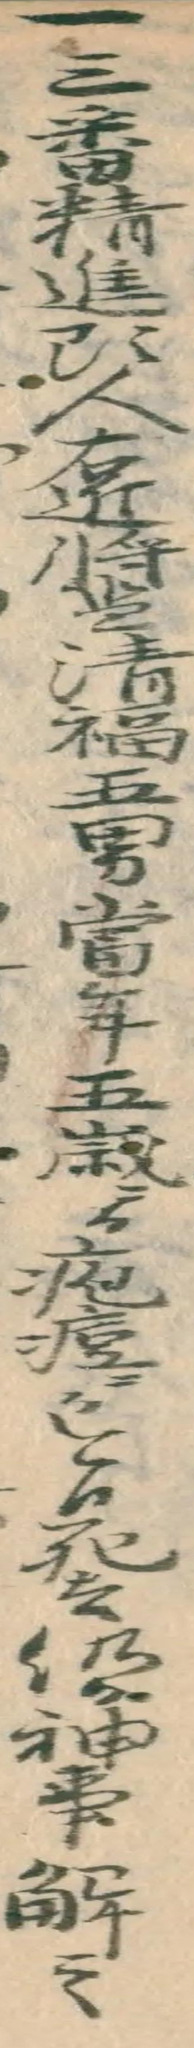一三番精進頭人右近将監清福五男当年五歳ニ而疱瘡ニ而今日死去仍而神事解之
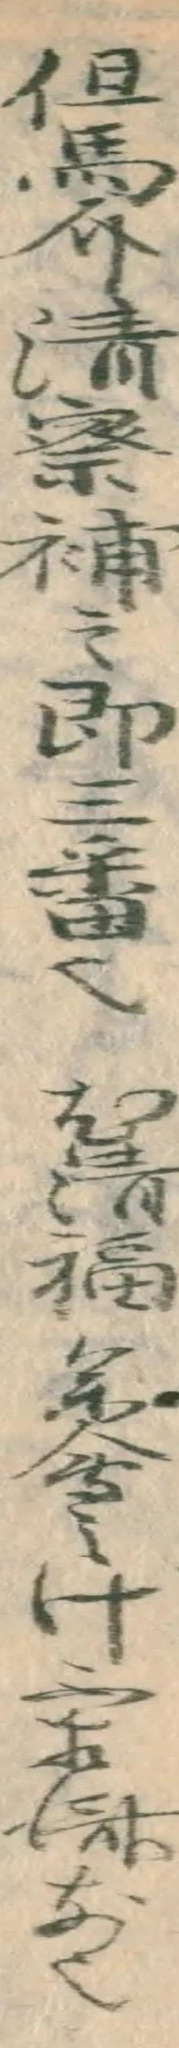但馬介清察補之即三番也尤清福参会之汁？不相済前也
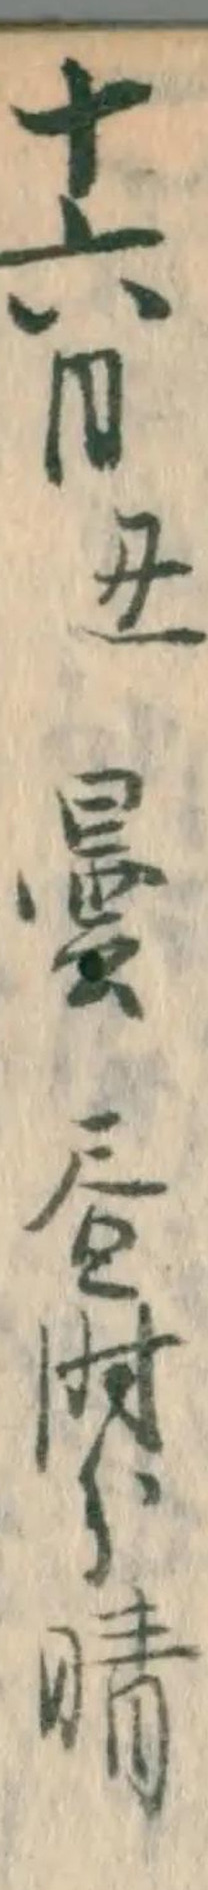十六日丑曇昼時分晴
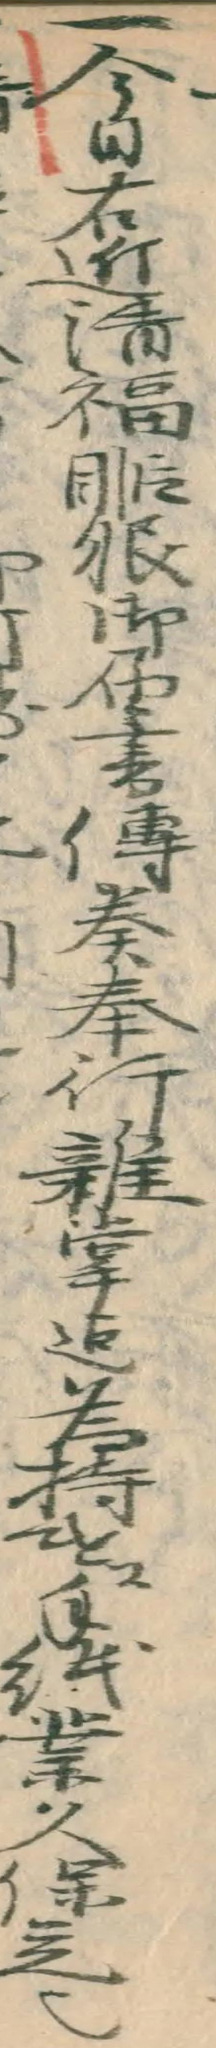一今日右近清福暇服御届書伝秦奉行雑掌迄為持遣ス手紙業久保覚也
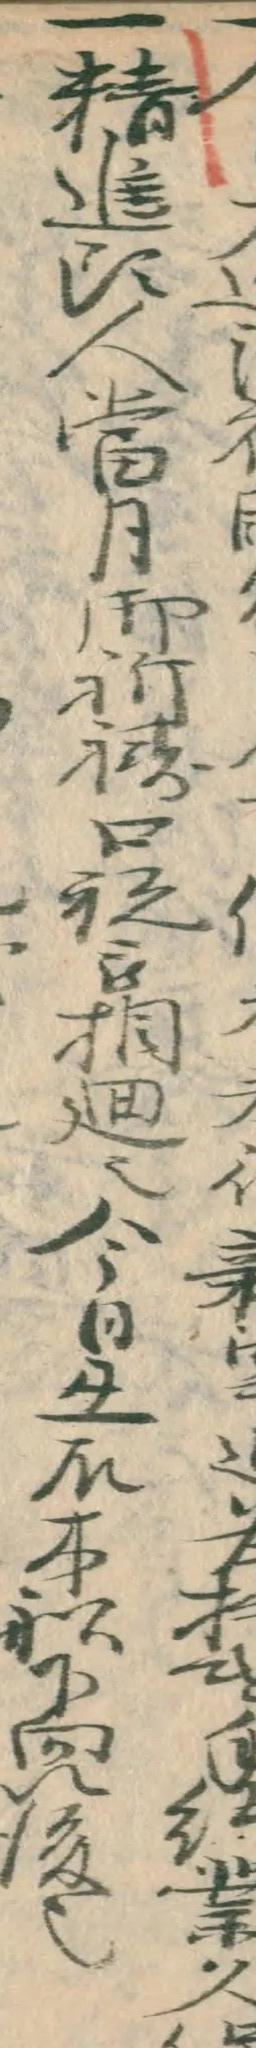一精進頭人当月御祈祷口祝被相廻也今日丑故木船下向以後也
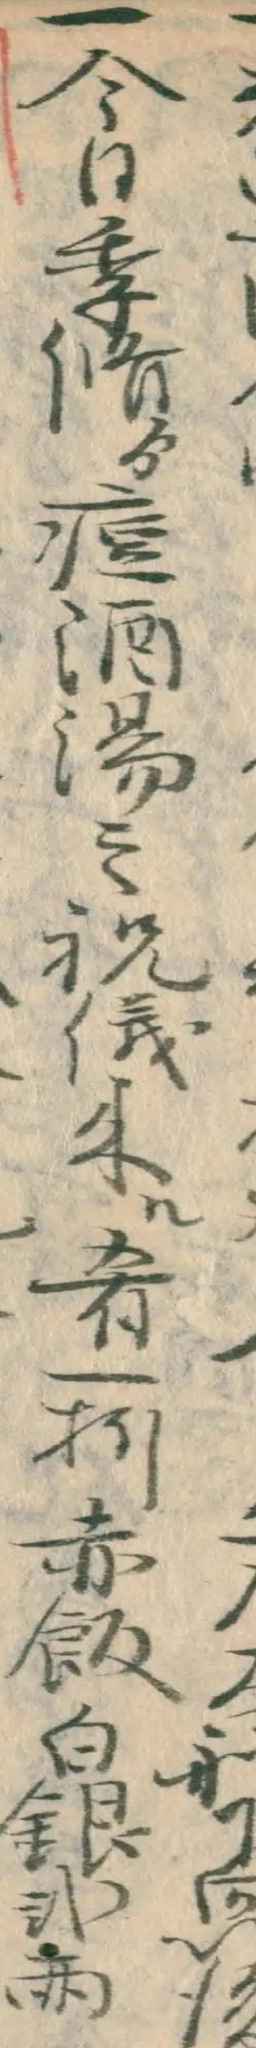一今日季脩ゟ痘酒湯之祝儀来ル肴一折赤飯白銀弐両
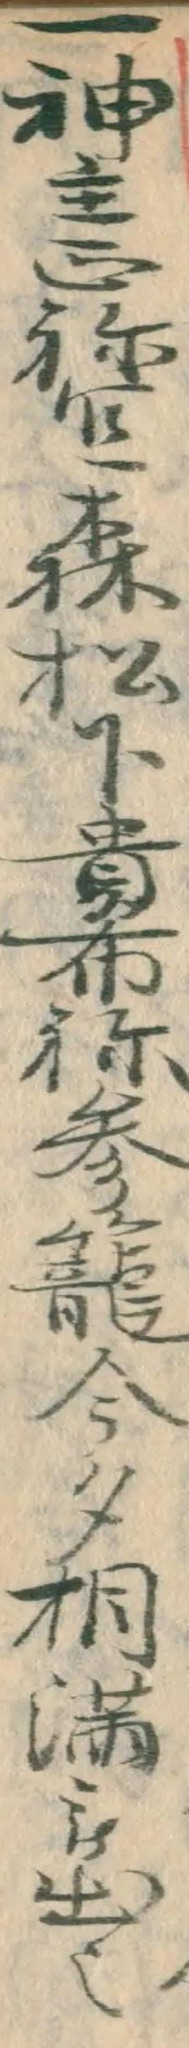一神主正祢宜森松下貴布祢参籠今夕相満被出也
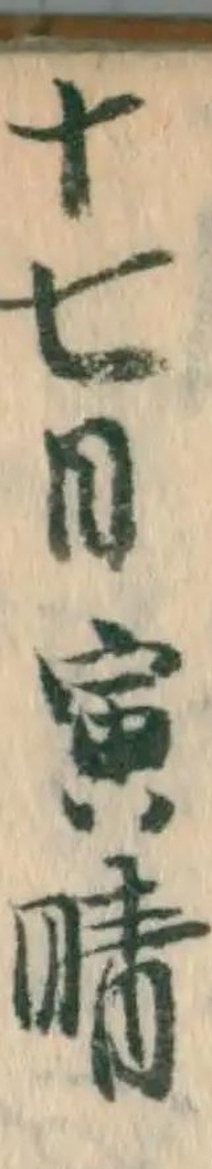十七日寅晴
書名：賀茂社記録. 第58冊
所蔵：国立国会図書館 National Diet Library, JAPAN
